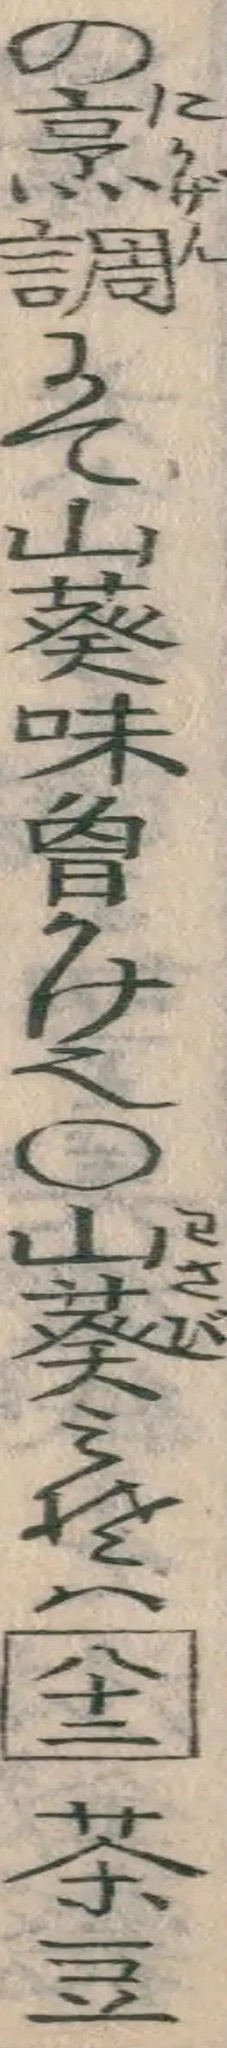の烹調にて山葵味曽かけ也◯山葵みそは[八十二]茶豆
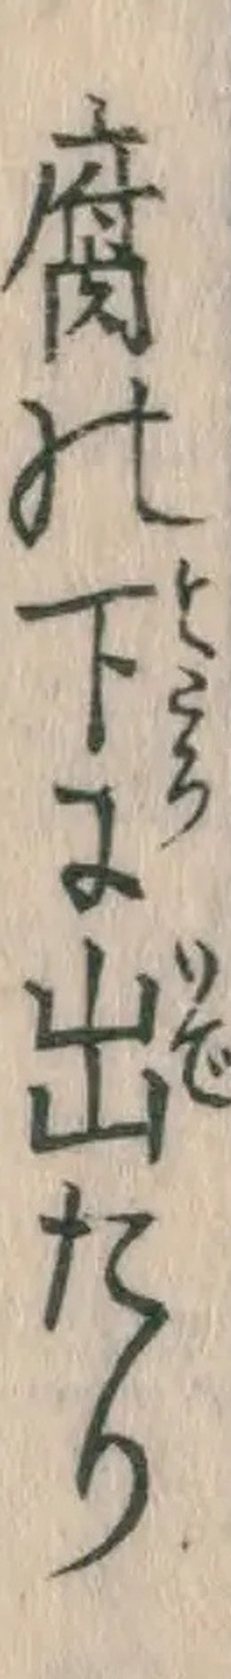腐の下に出たり
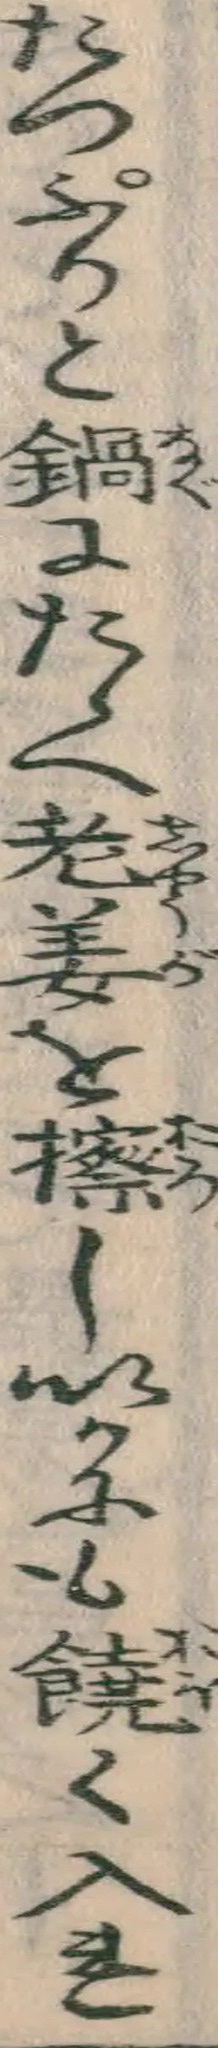たつぷりと鍋にたゝへ老姜を擦しいかにも饒く入れ
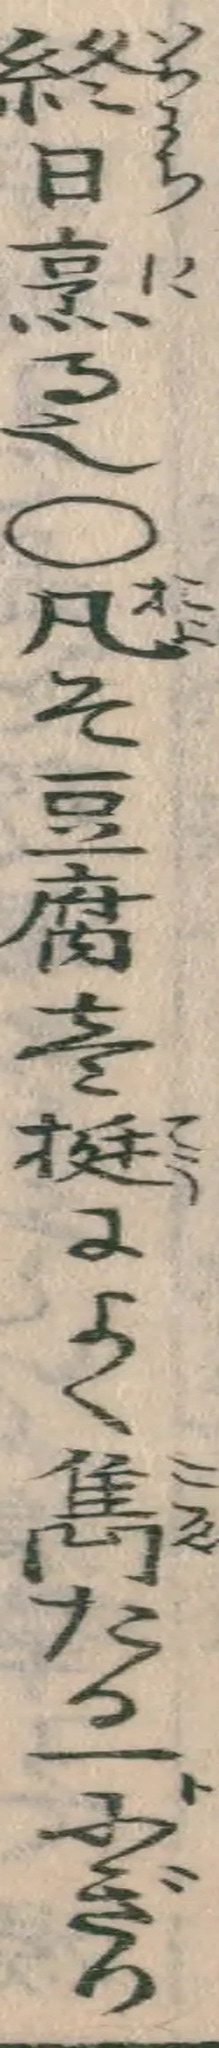終日烹る也◯凡そ豆腐壱挺によく雋たる一兔ㇳにぎり
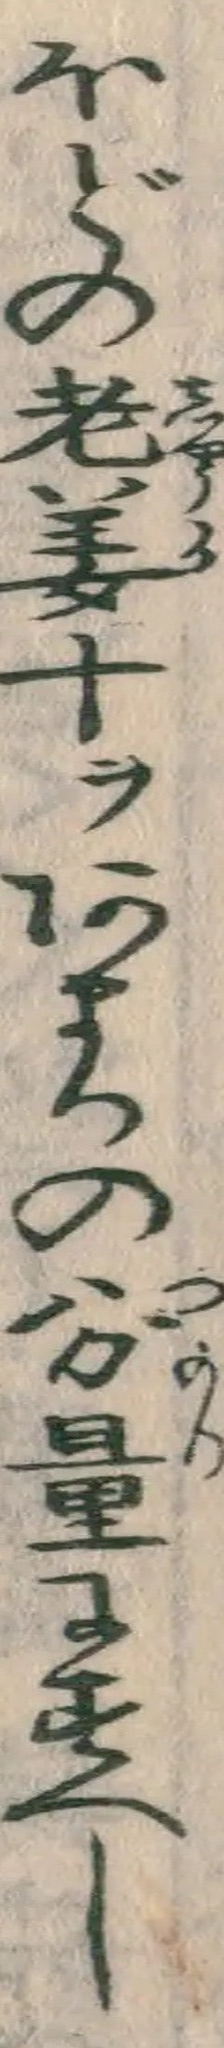ほどの老姜十ヲあまりの分量にすへし
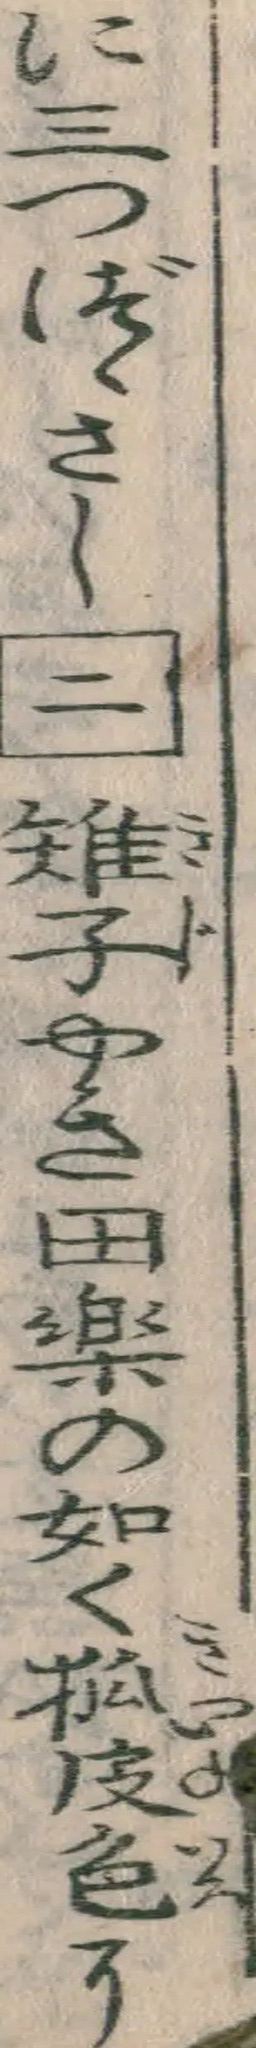に三つづゝさし[二]雉子やき田楽の如く狐皮色に
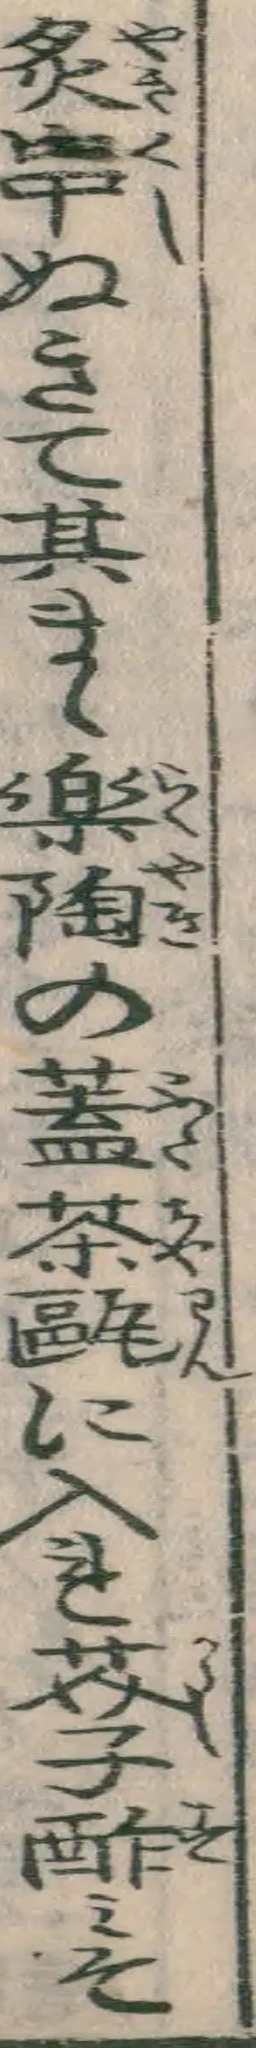灸串ぬきて其まゝ楽陶の蓋茶甌に入れ芥子酢みそ
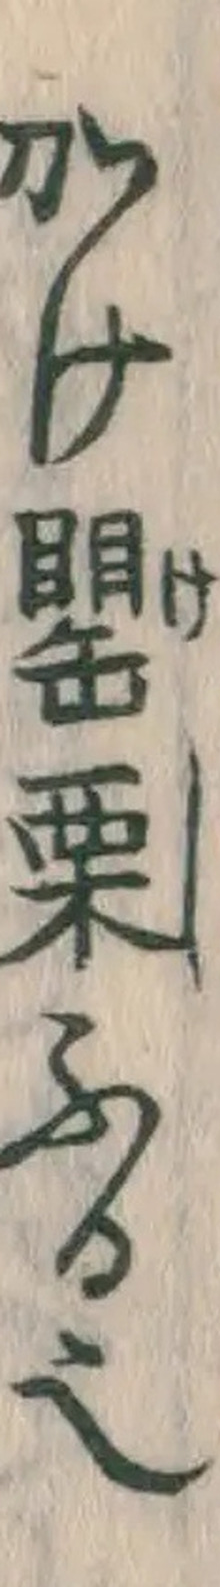かけ罌粟ふる也

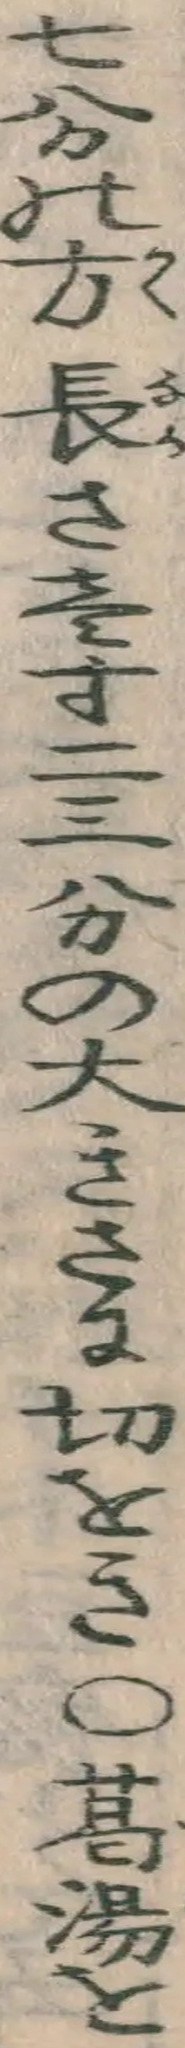七分の方長さ一寸二三分の大きさに切をき○葛湯を
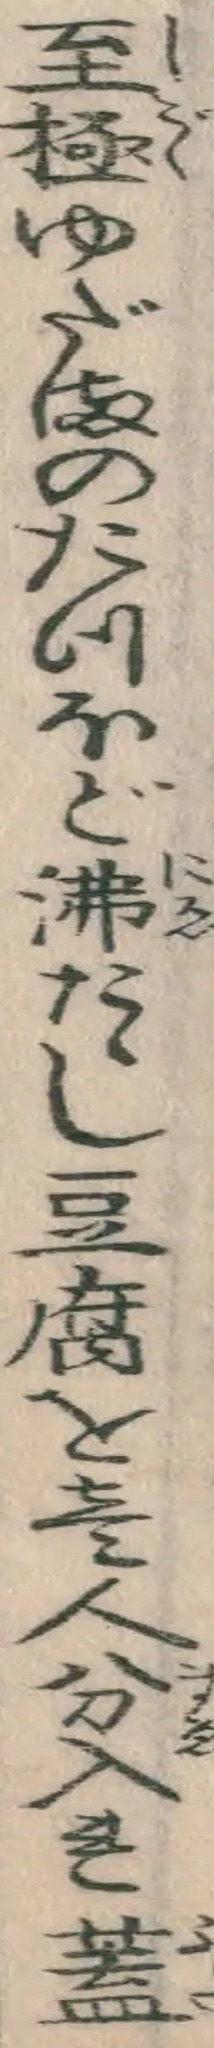至極ゆだまのたつほど沸たゝし豆腐を壱人分入れ蓋
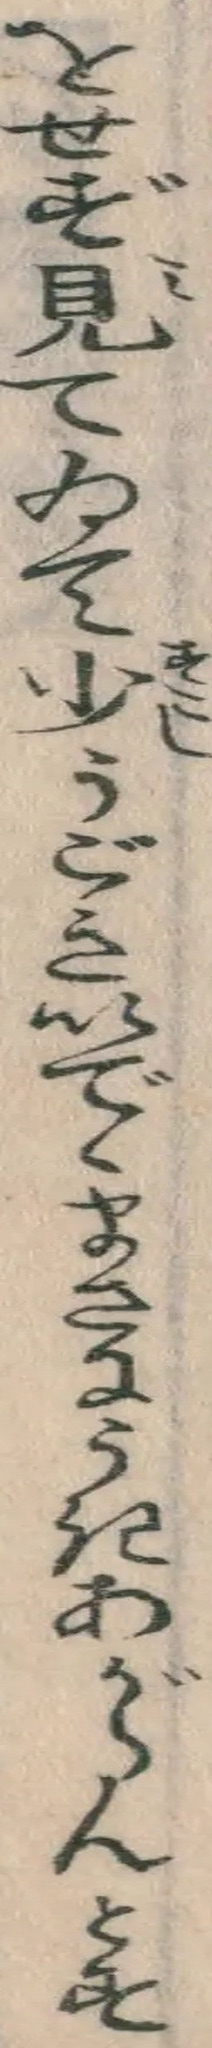をせず見てゐて少うごきいでゝまさにうきあがらんとす
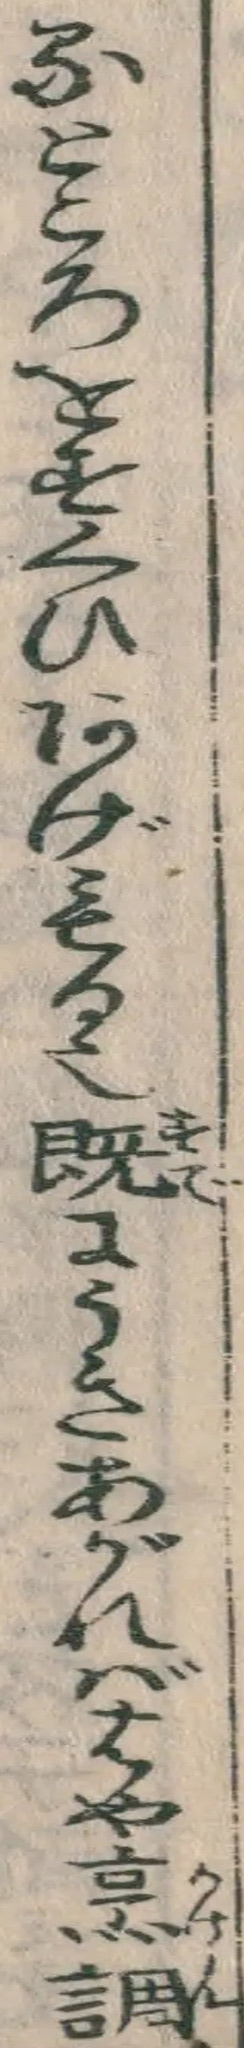るところをすくひあげもる也既にうきあがればはや烹調
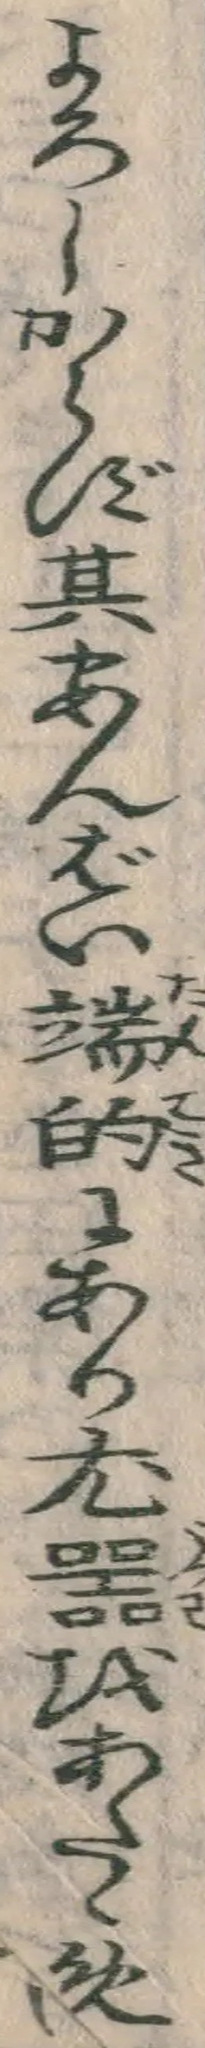よろしからず其あんばい端的にあり尤器をあたゝめ
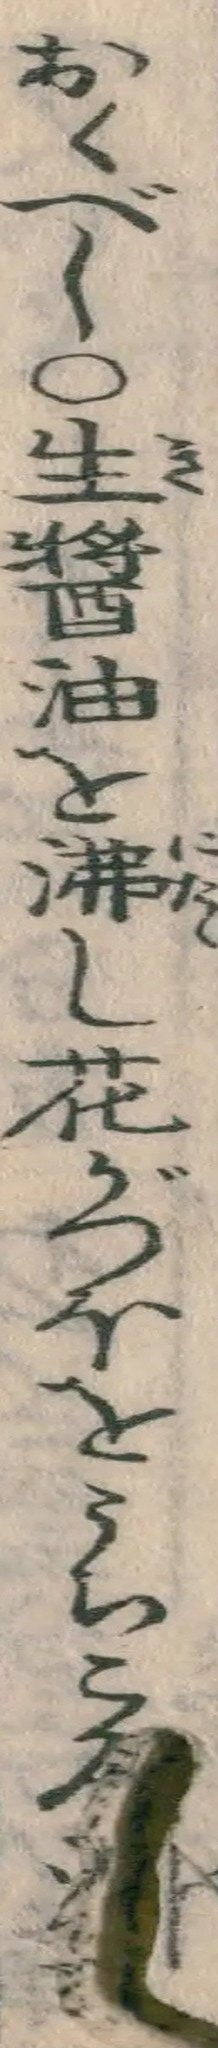おくべし○生醤油を沸し花がつほをうちこ
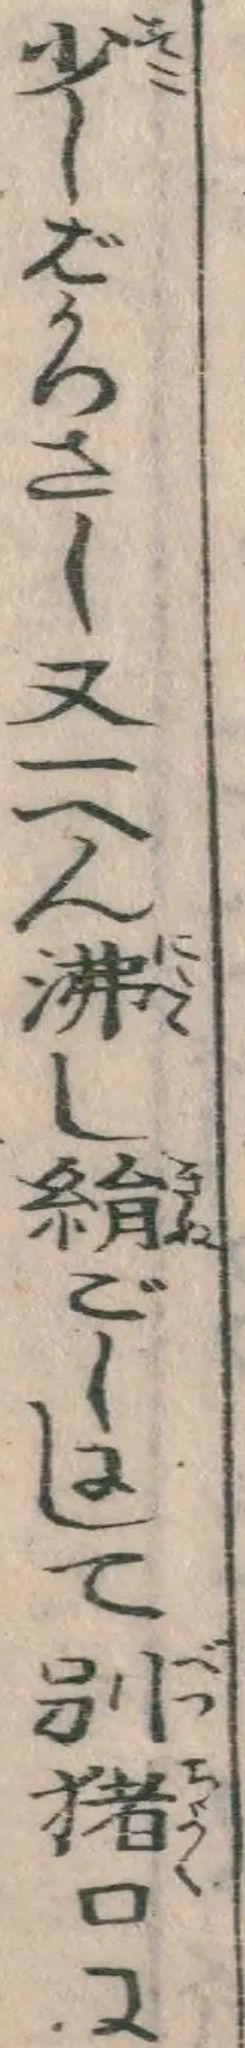少しばかりさし又一へん沸し絹ごしにして別猪口に
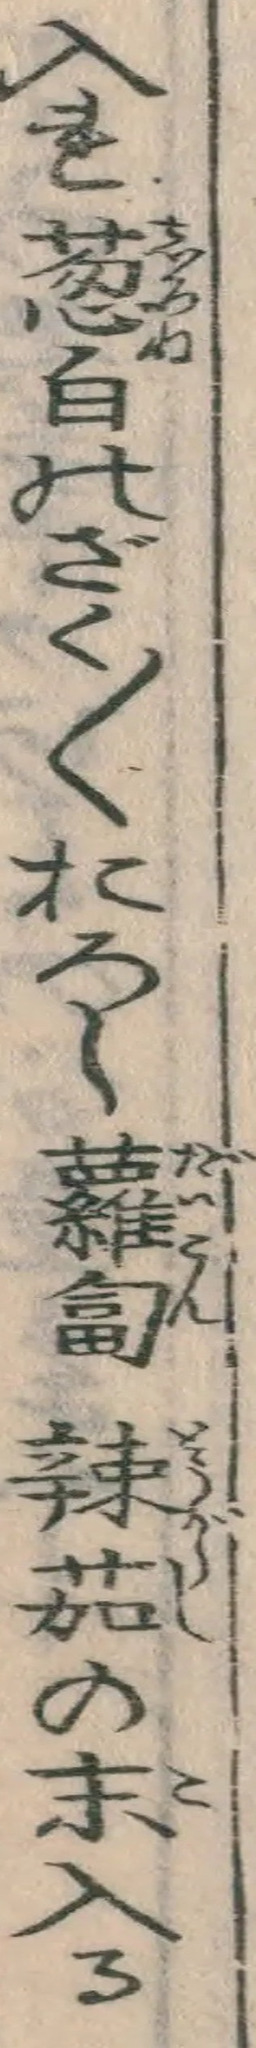入れ葱白のざく〳〵おろし蘿匐辣茄の末入る
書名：豆腐百珍. [正編]
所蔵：国立国会図書館 National Diet Library, JAPAN
